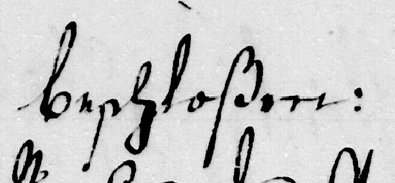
beschloßen:
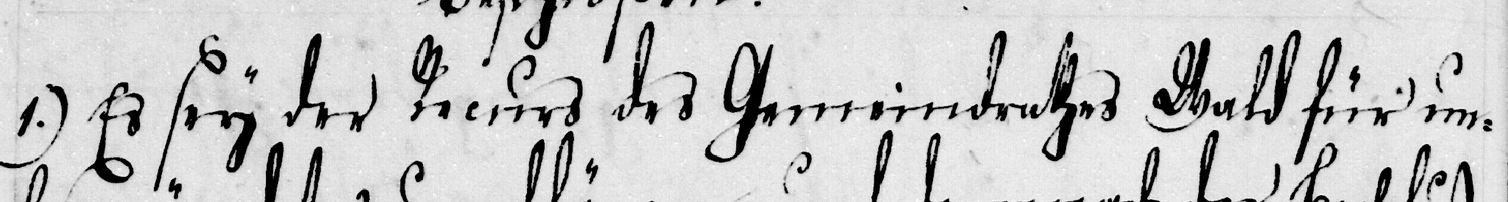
1.) Es sey der Recurs des Gemeindrathes Wald für un¬
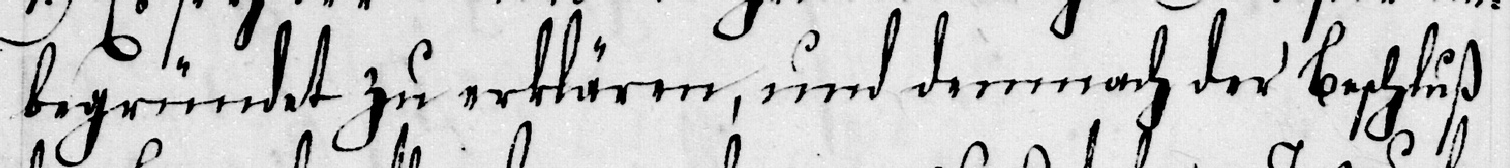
begründet zu erklären, und demnach der Beschluß
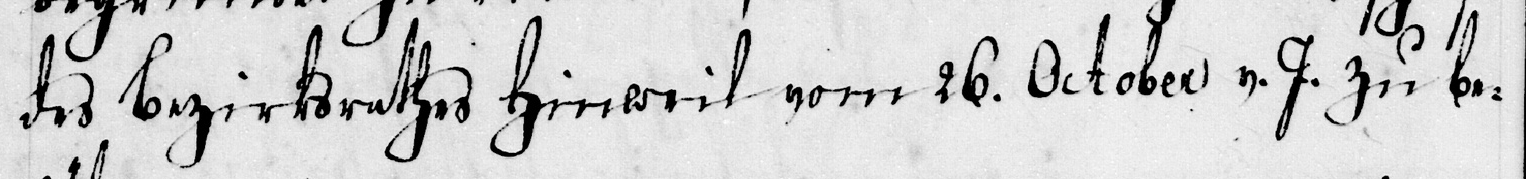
des Bezirksrathes Hinweil vom 26. October v. J. zu be¬
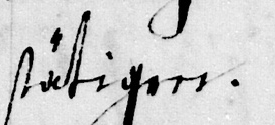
stätigen.
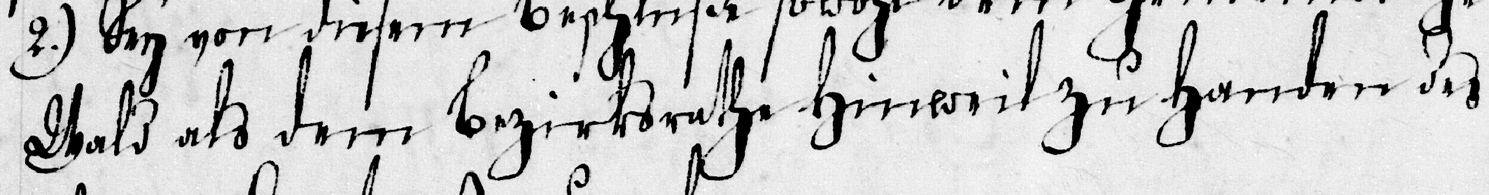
Wald als dem Bezirksrathe Hinweil zu Handen des
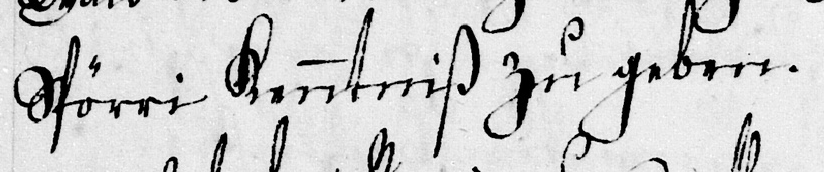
Spörri Kenntniß zu geben.
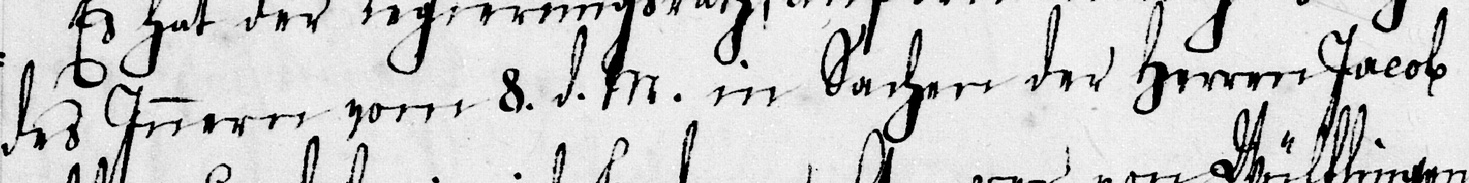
des Innern vom 8. d. M. in Sachen der Herren Jacob
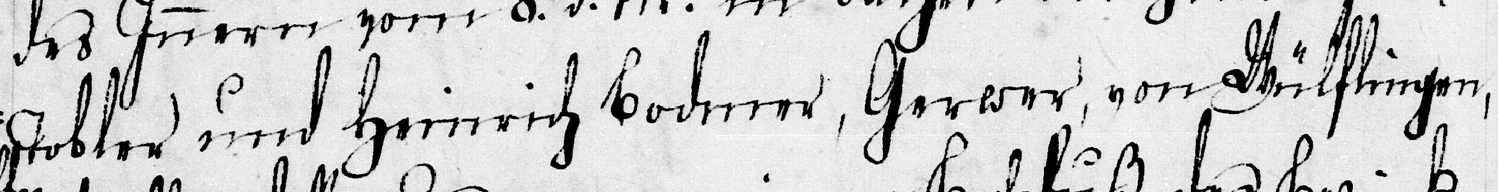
Tobler und Heinrich Bodmer, Gerwer, von Wülflingen,
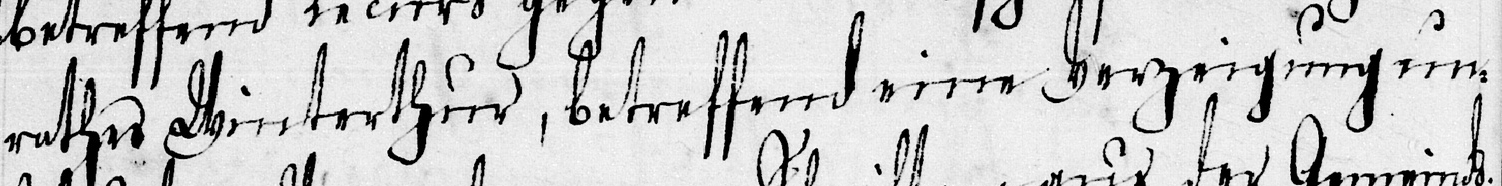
rathes Winterthur, betreffend eine Verzeigung unbe¬
